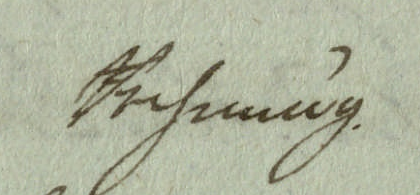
Rechnung.
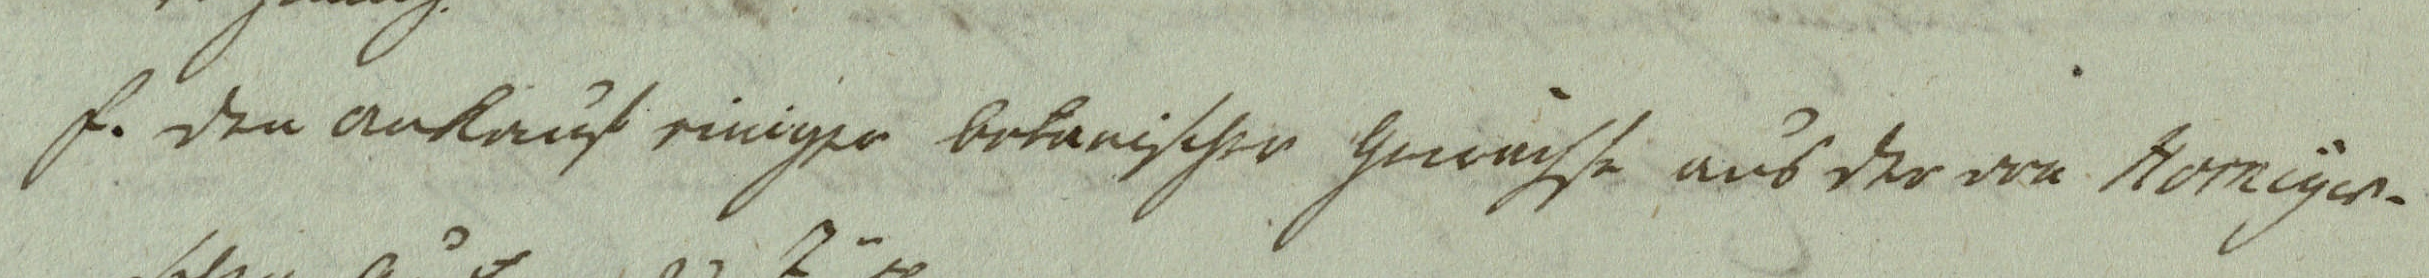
f. den Ankauf einiger botanischer Gewächse aus der von Homeÿer¬
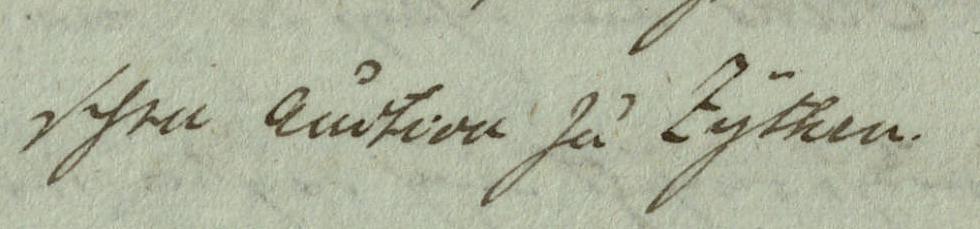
schen Auction zu Zÿthen.
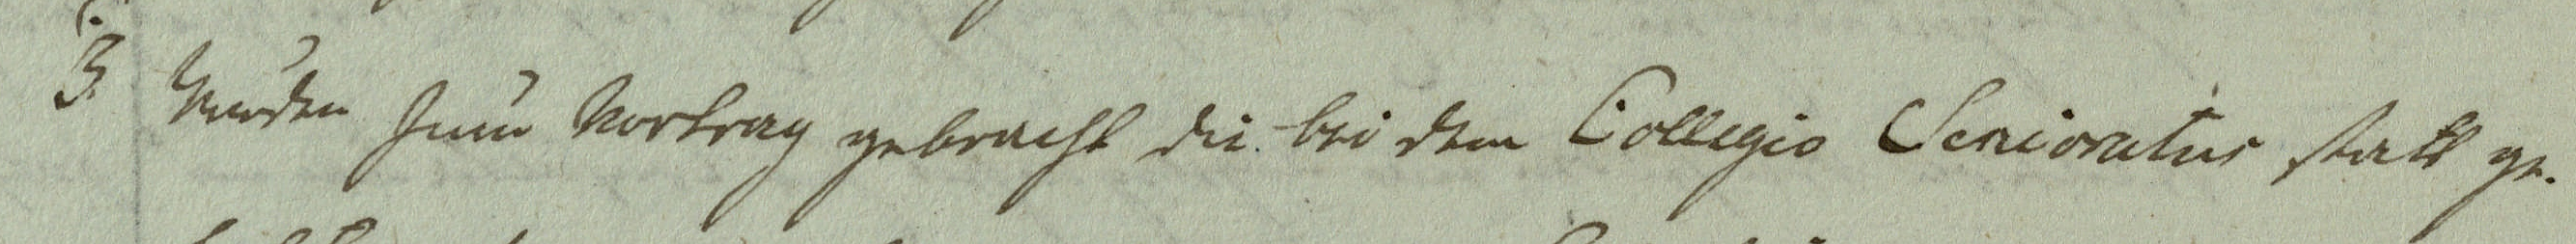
3. Werden zum Vortrag gebracht die bei dem Collegio Senioratus statt ge¬
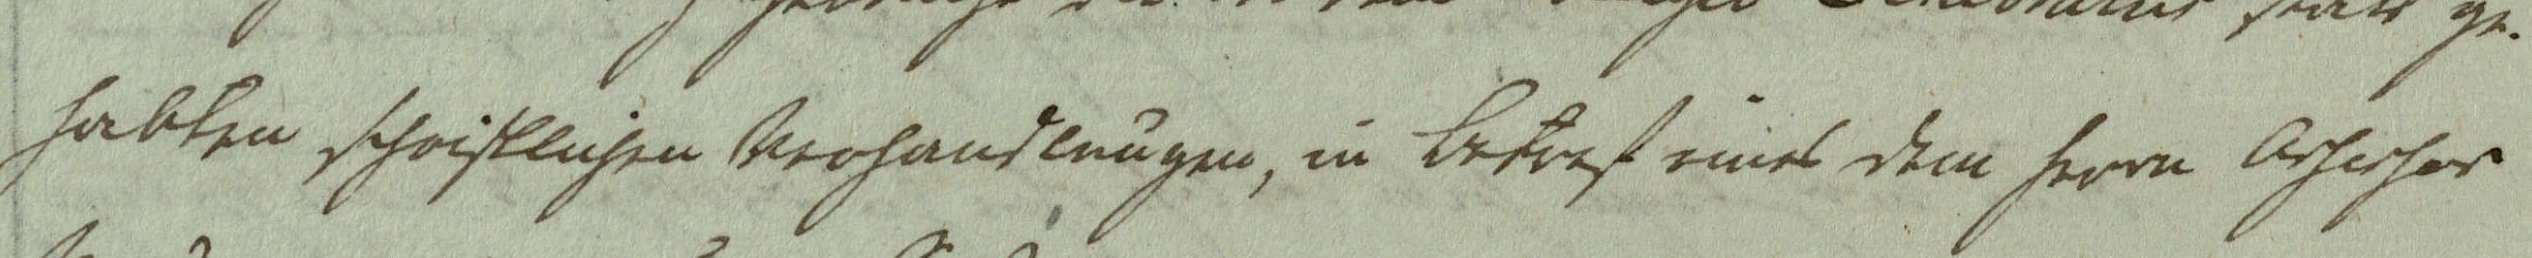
gehabten schriftlichen Verhandlungen, in Betref eines dem herrn Assessor
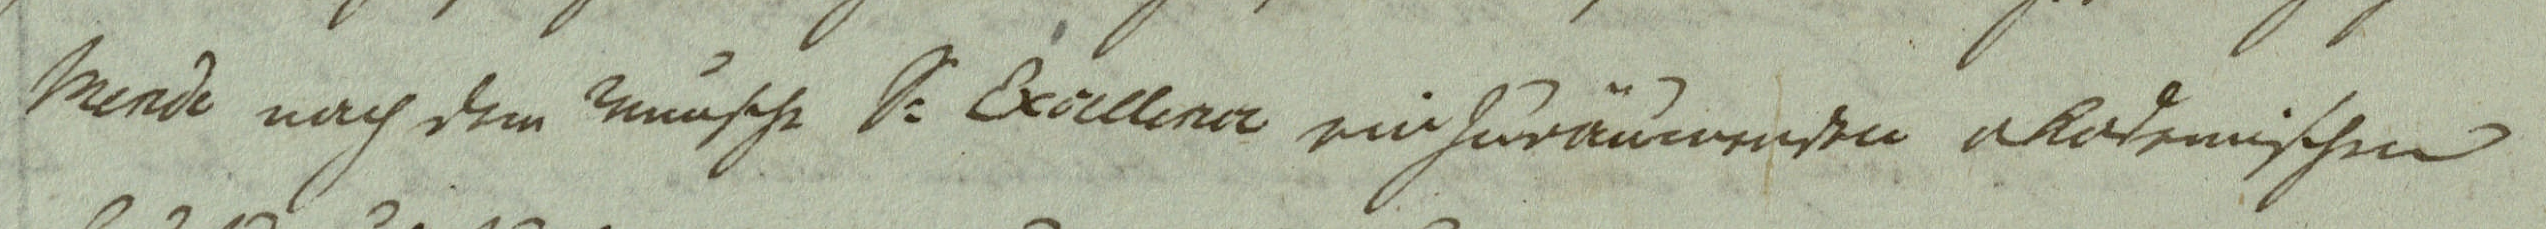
Mende nach dem Wunsche Sr. Excellence einzuräumenden akademischen
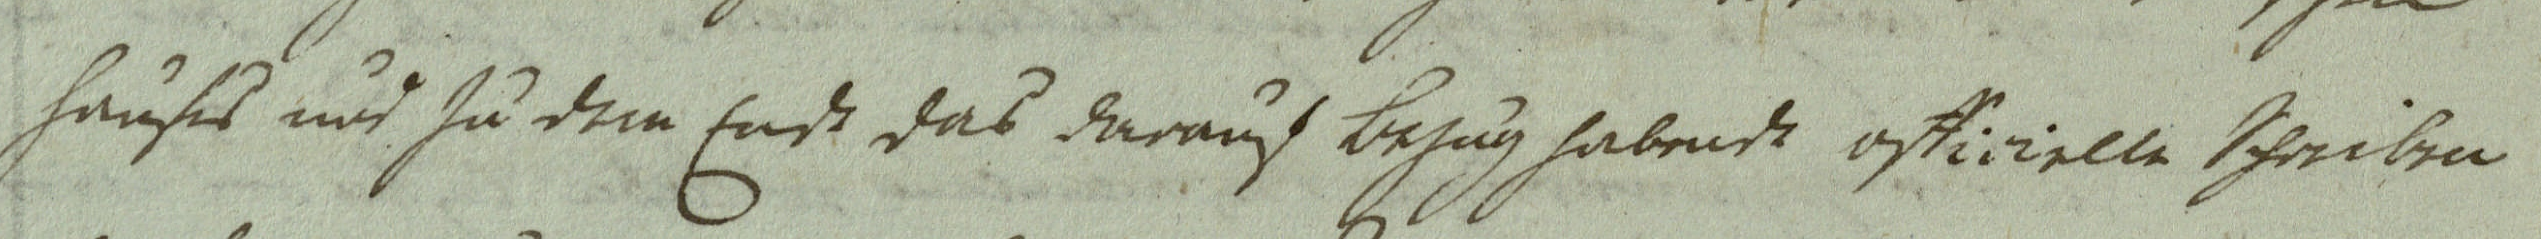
hauses und zu dem Ende das darauf Bezug habende officielle Schreiben
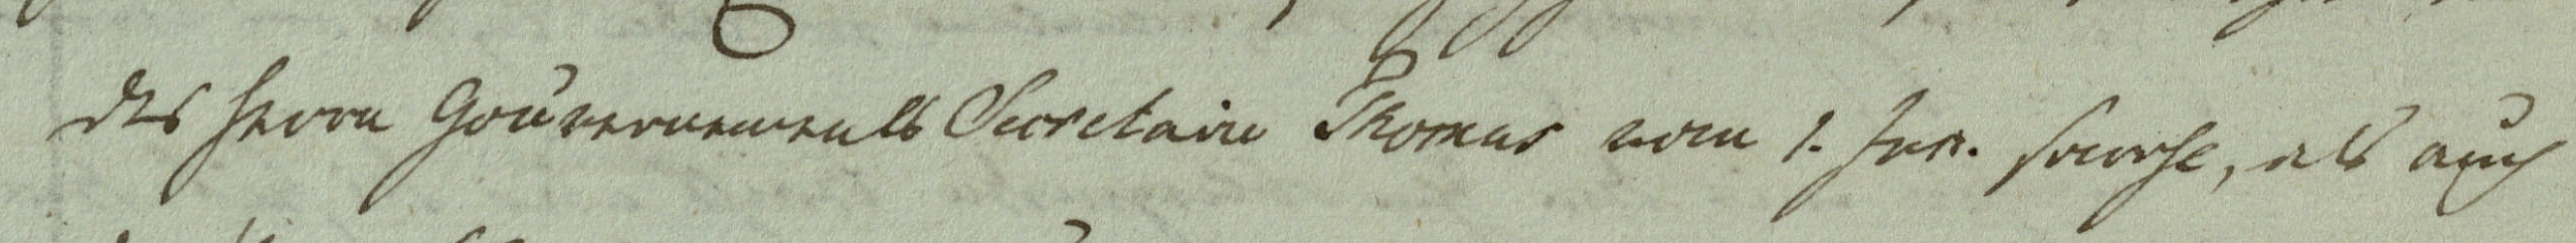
des herrn Gouvernements Secretair Thomas vom 1. Jun. sowohl, als auch
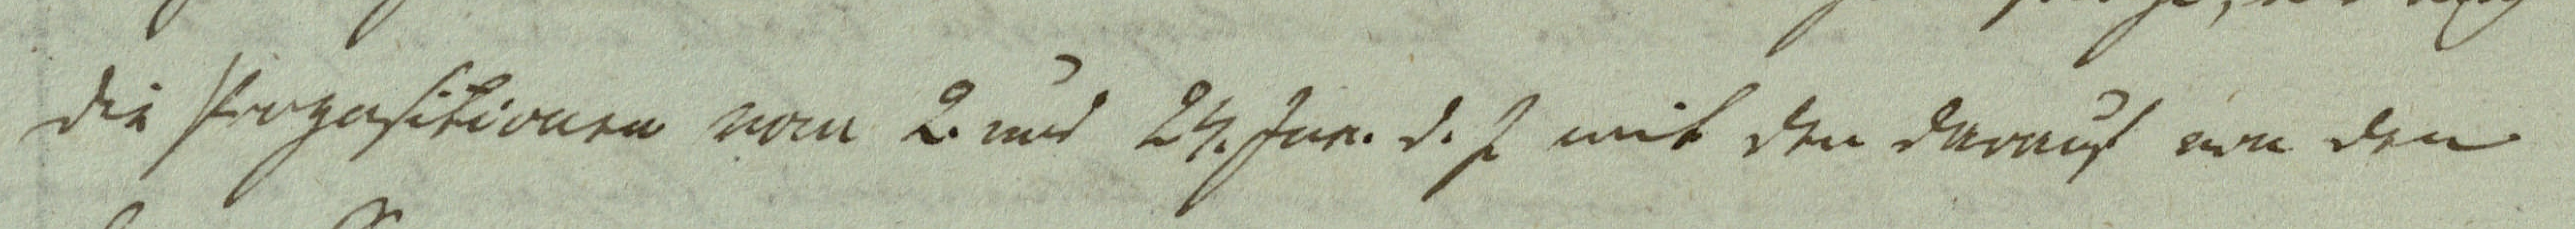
die Propositionen vom 2. und 24. Jun. d. J. mit den darauf von den
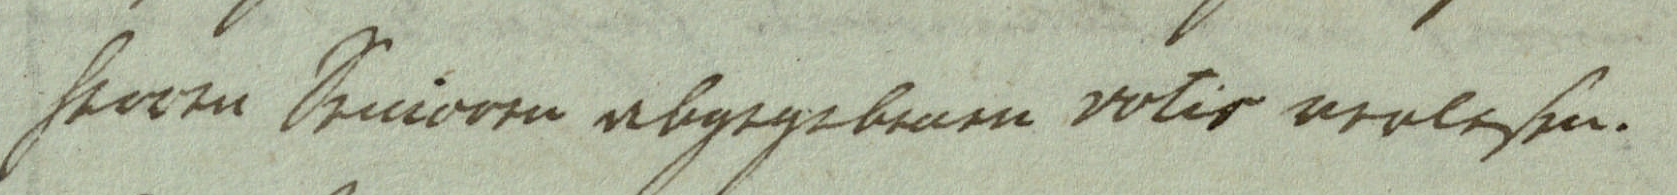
herren Senioren abgegebenen votis verlesen.
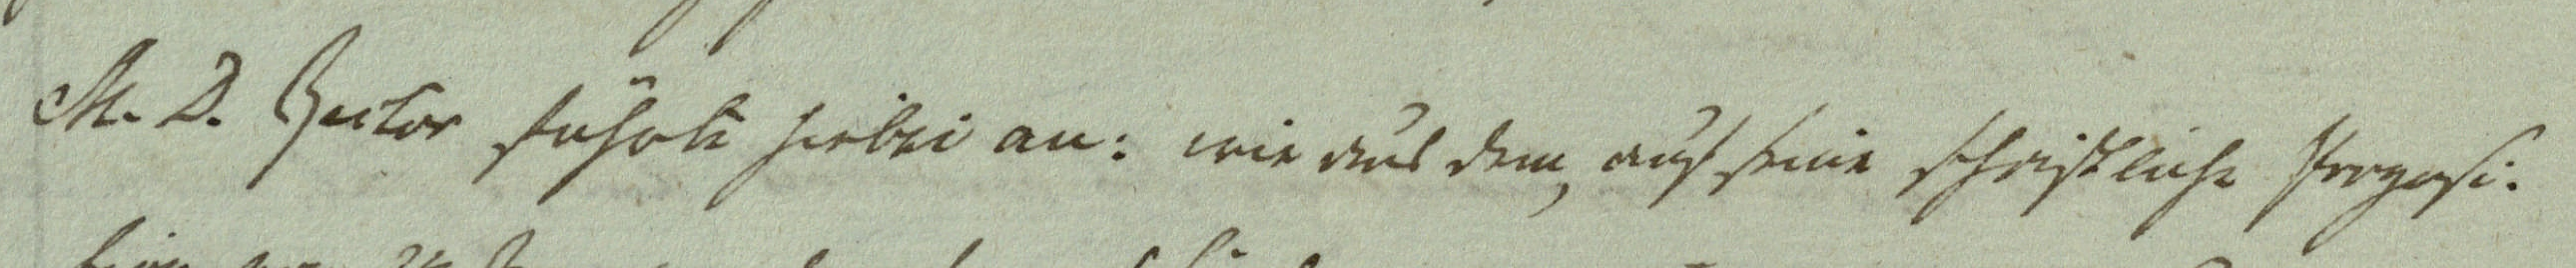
M. D. Rector führte hiebei an: wie aus dem, auf seine schriftliche Proposi¬
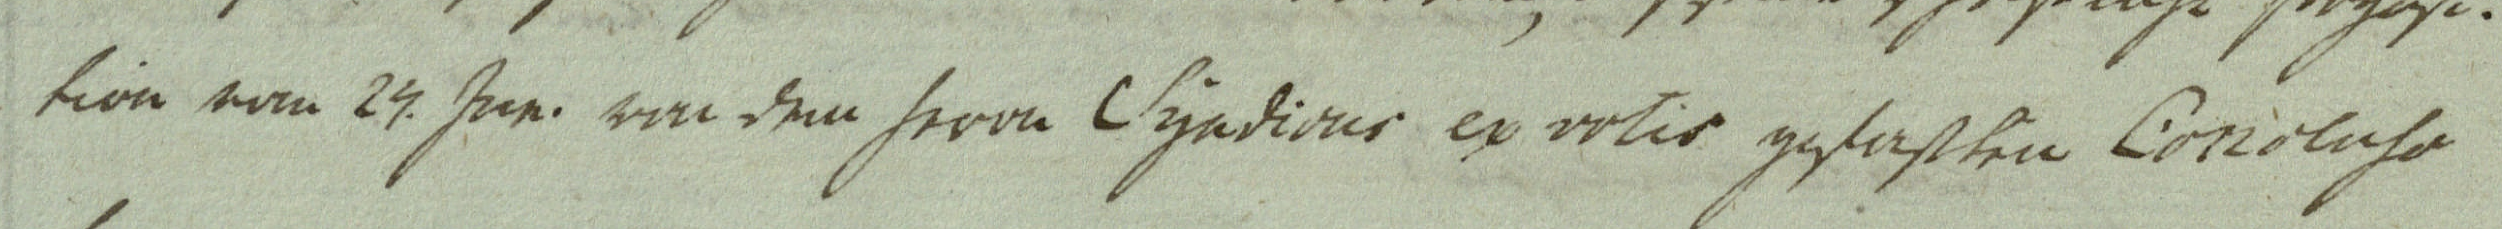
tion vom 24. Jun. von dem herrn Sÿndicus ex votis gefaßten Concluso
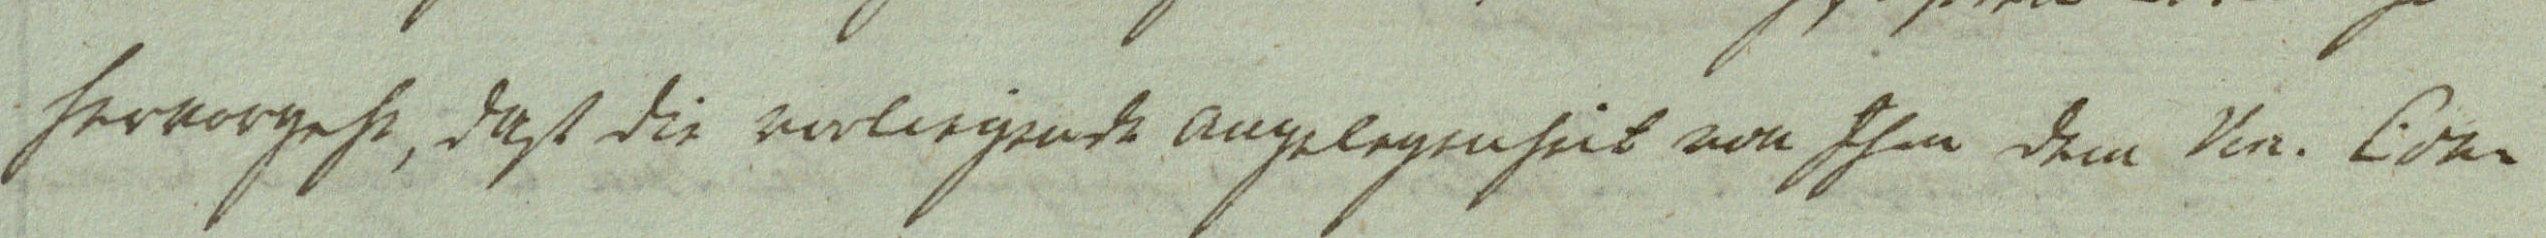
hervorgeht, daß die vorliegende Angelegenheit von Ihm dem Ven. Con¬
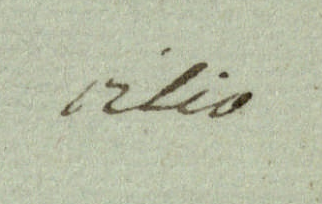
cilio
